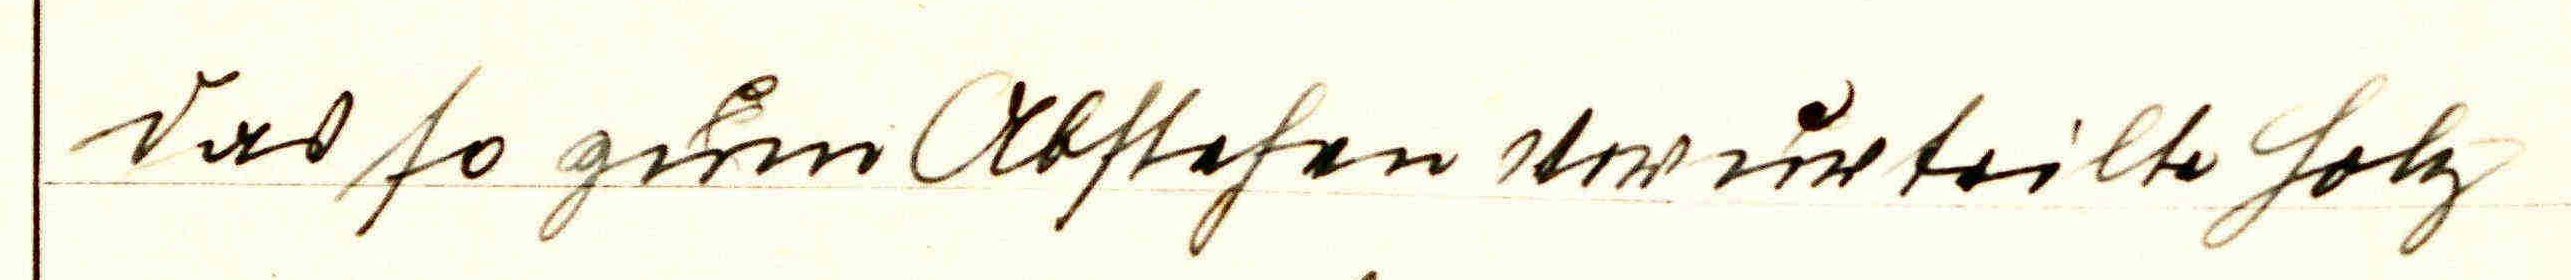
das so zum Absesen zur teilte so
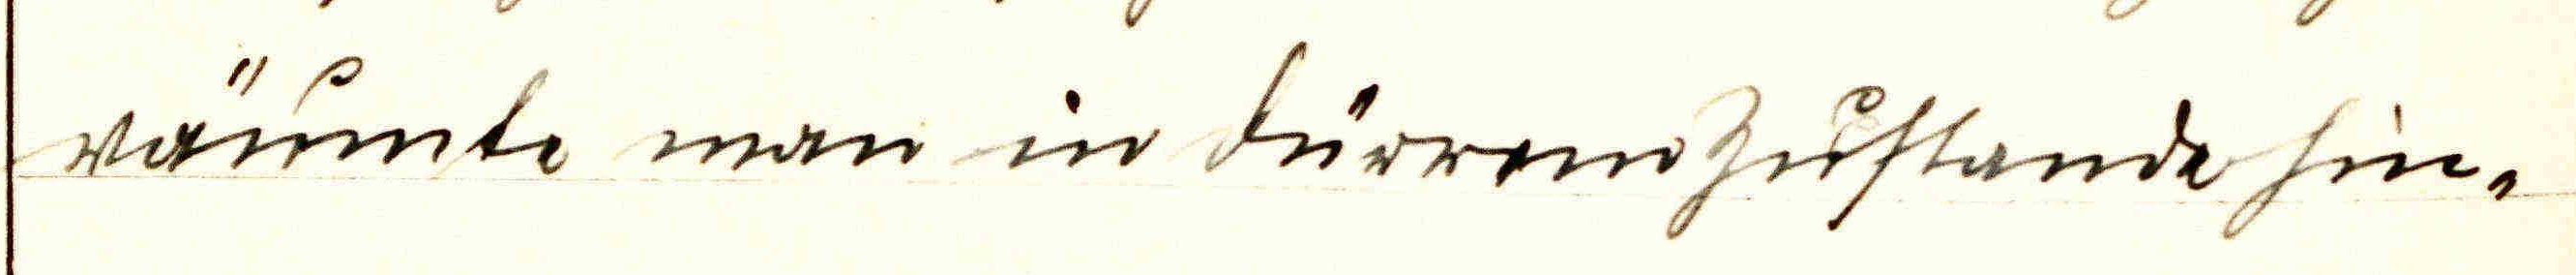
konnte an in der goroin zustande in¬
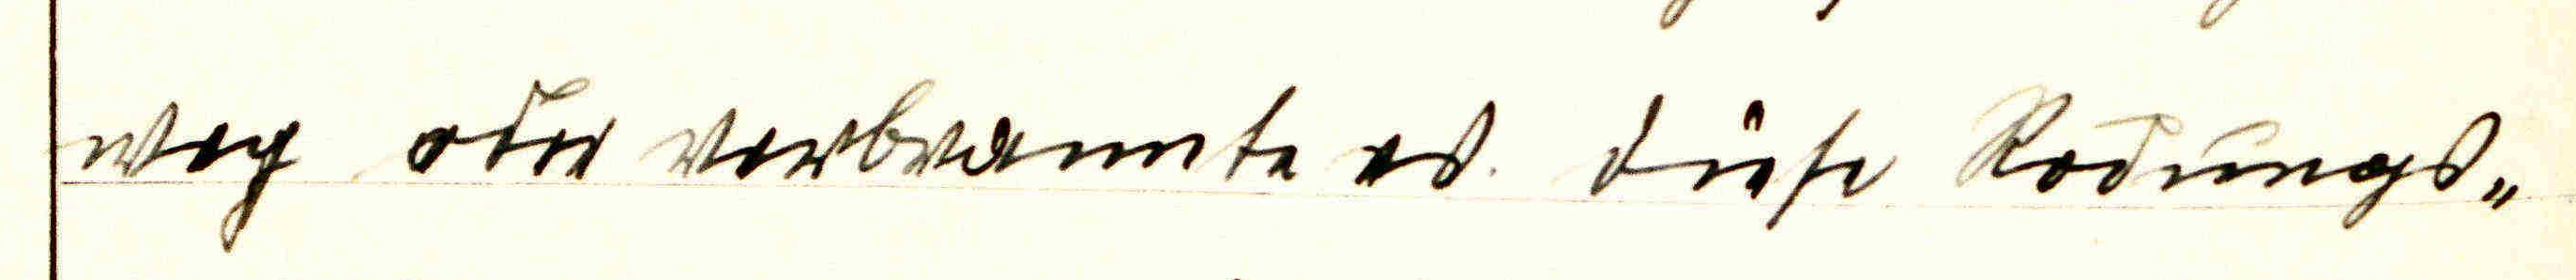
wir ob tirbdä unter er diese Forderung
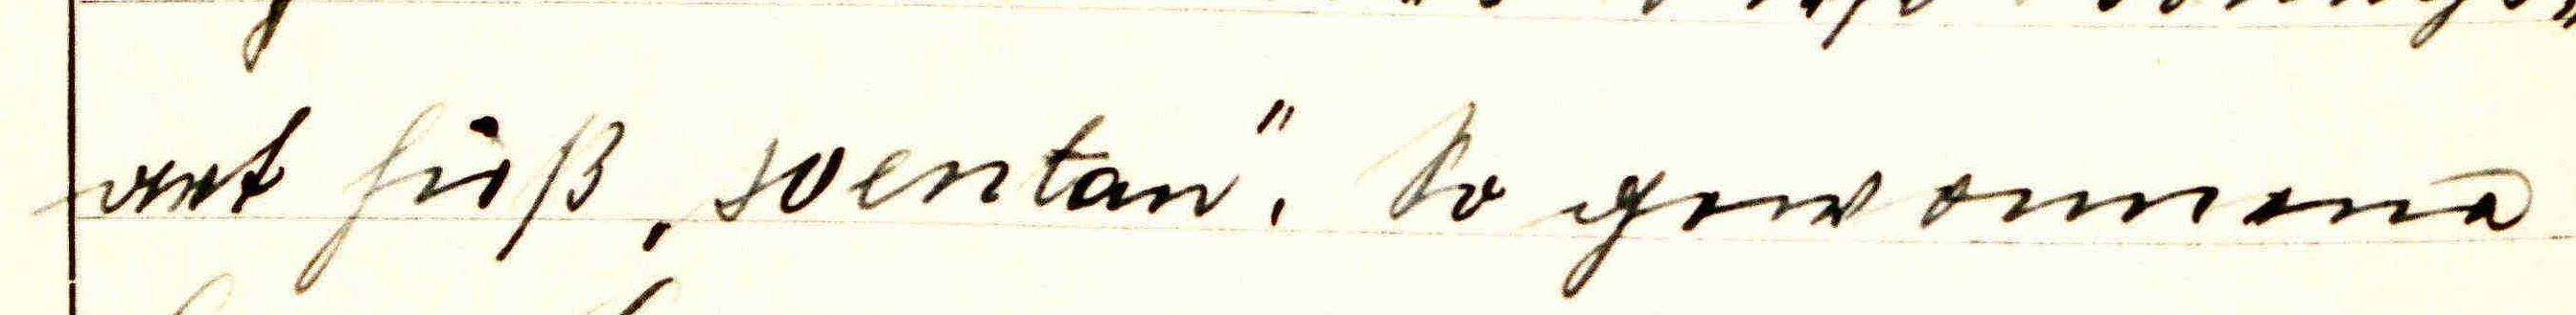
Statuts 0 an ein rennoni
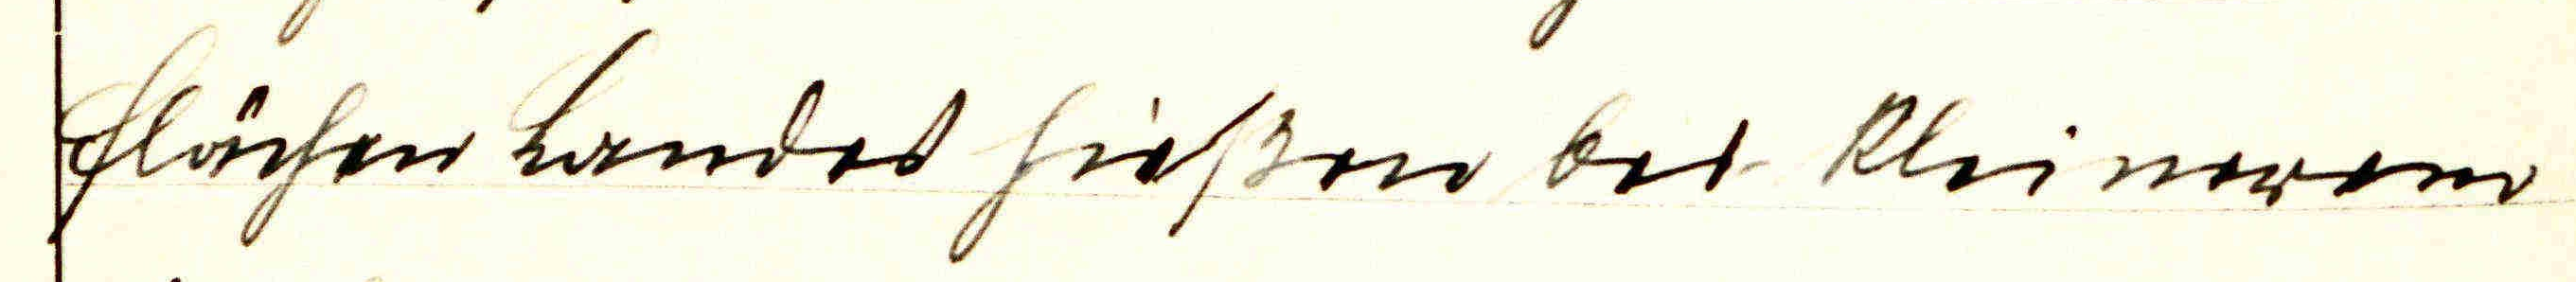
Elöchen Handel diesen bis bei worden
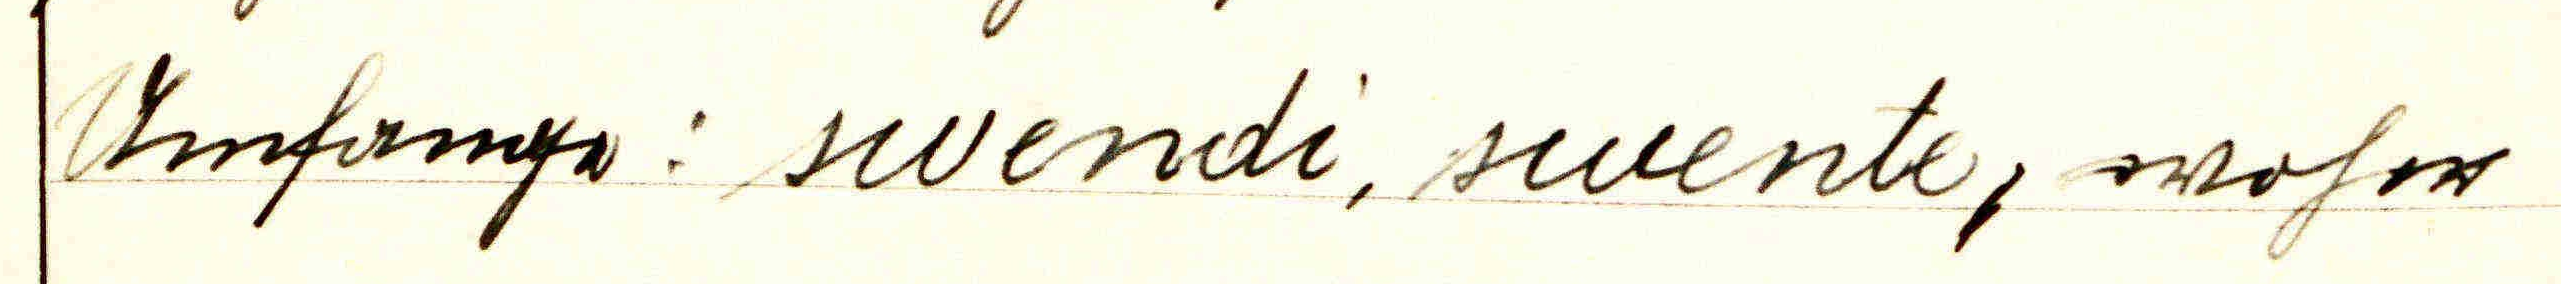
Anfang" den, stlnle, vom
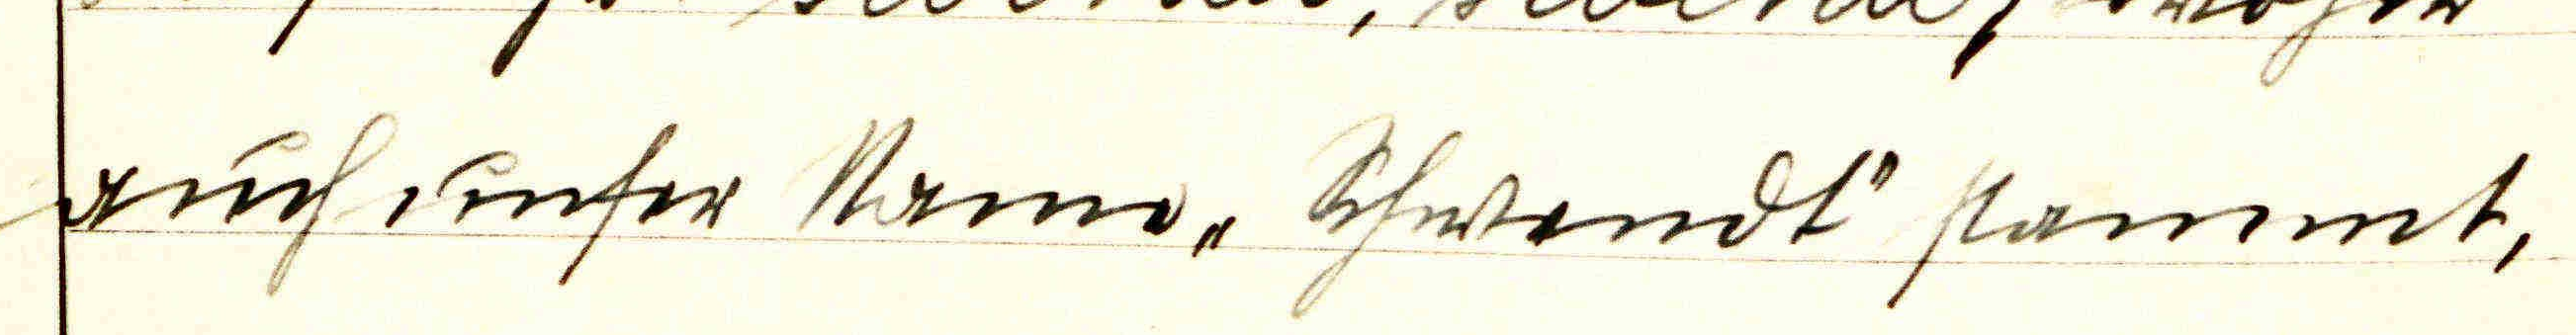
auch einer Namen annimmt,
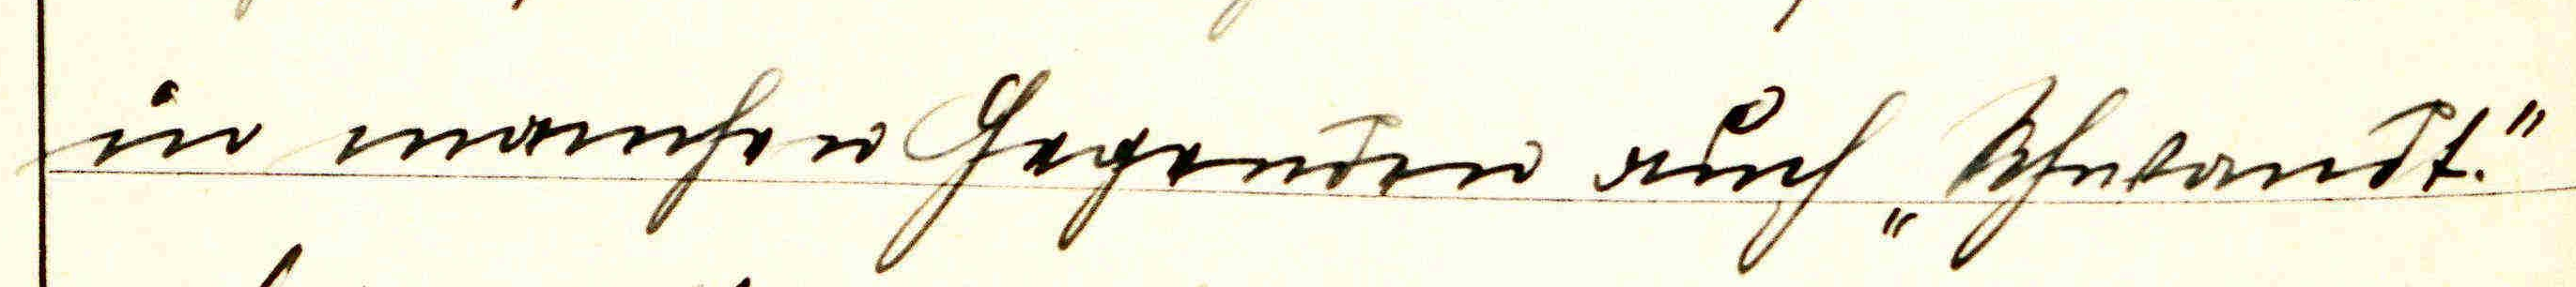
von Gewinn auch Stande.
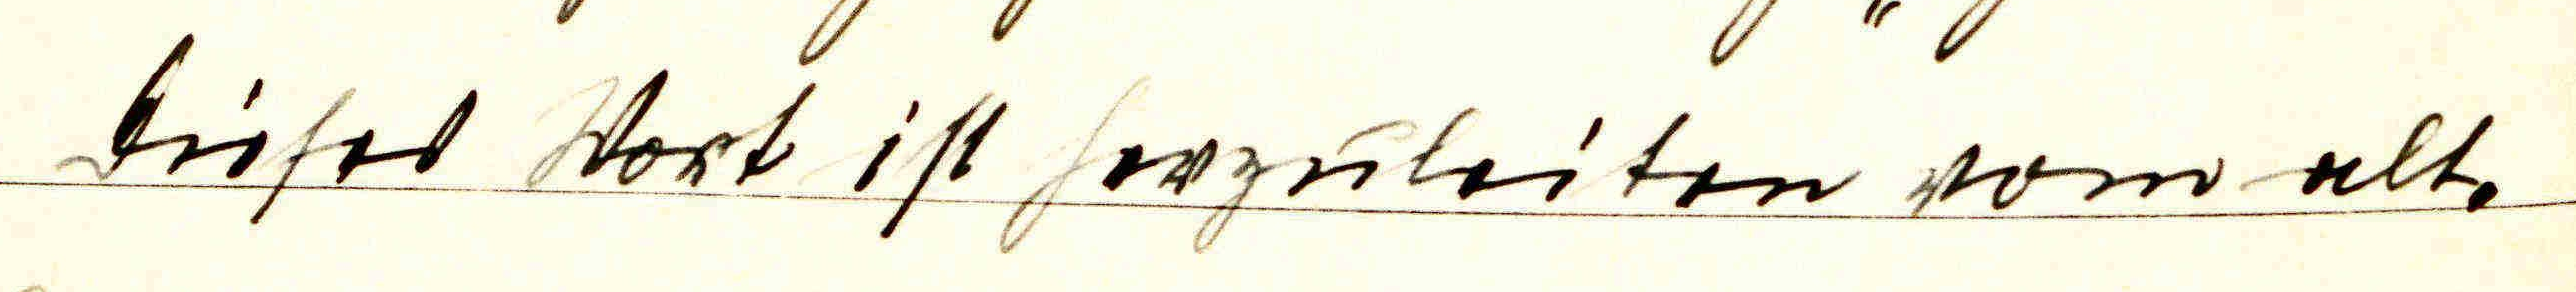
büeses vor 1 herzuleiten von alten
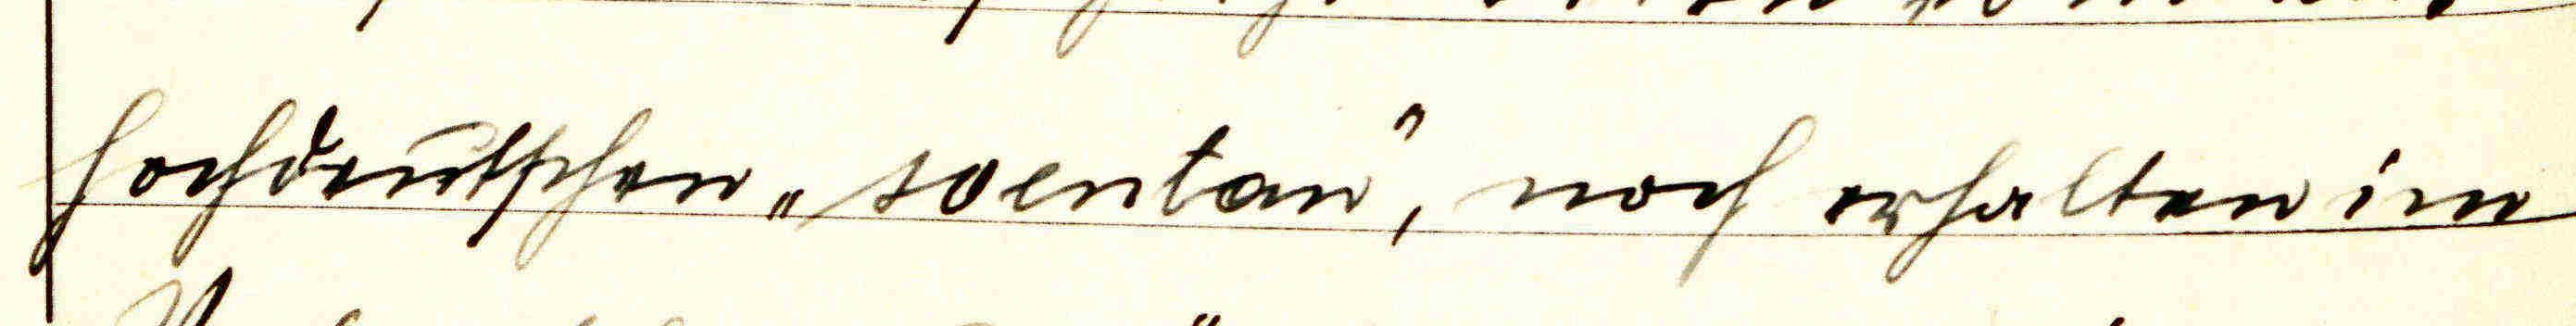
ohlethtamban, noch erhalten die
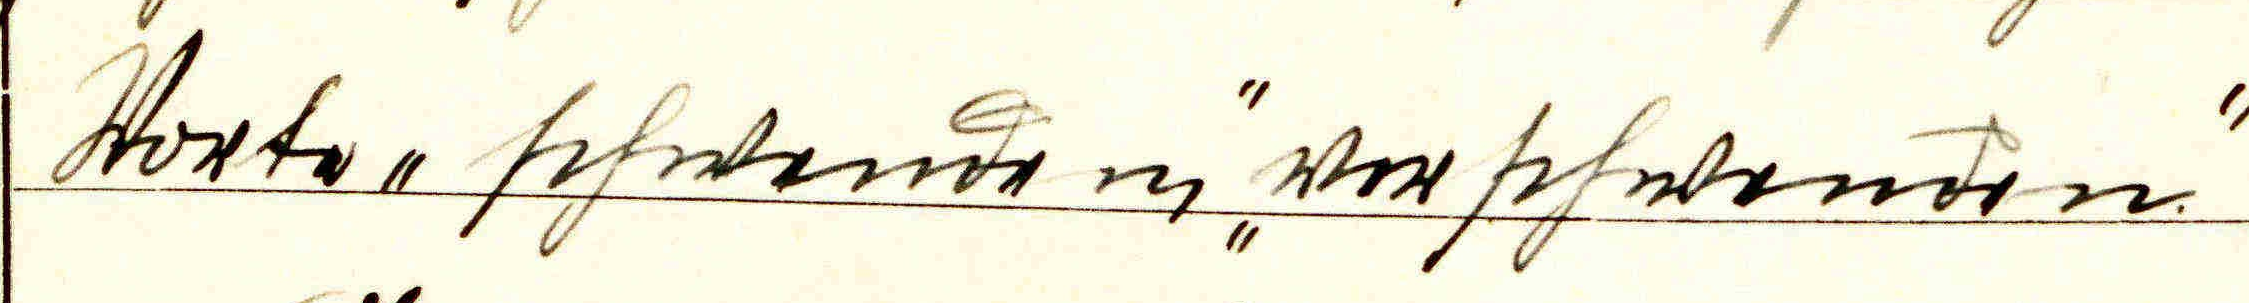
treten schätzende in trshlend
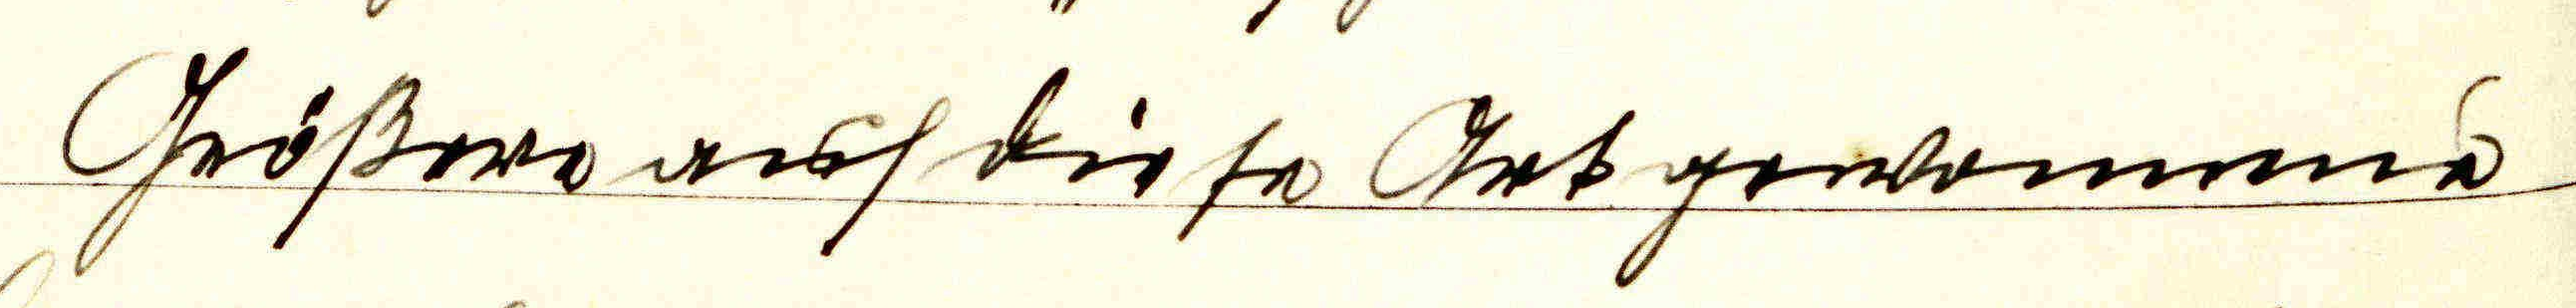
erweist diese Ort grühommne
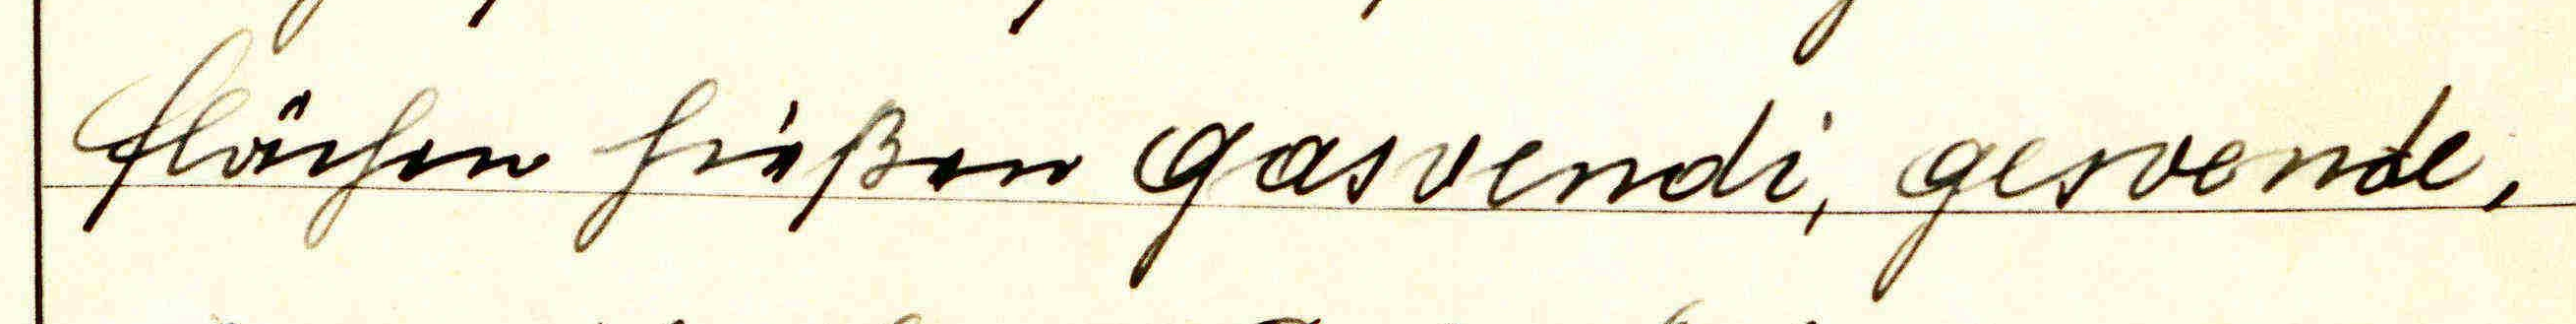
tläehn hin Anteil, Ende
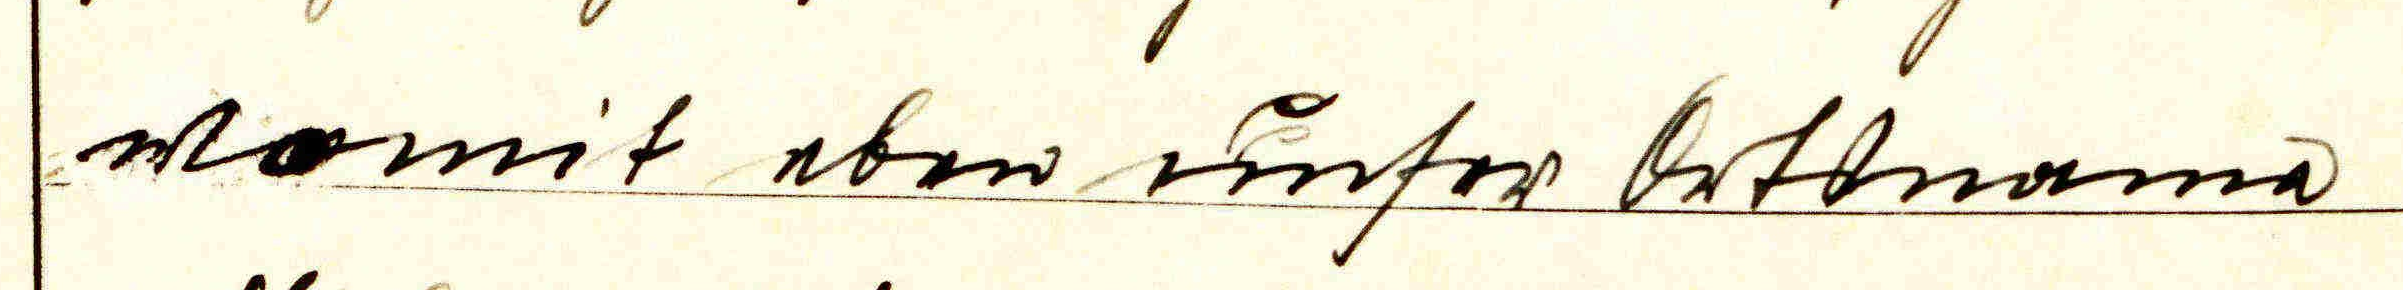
sonst oben unter btname.
